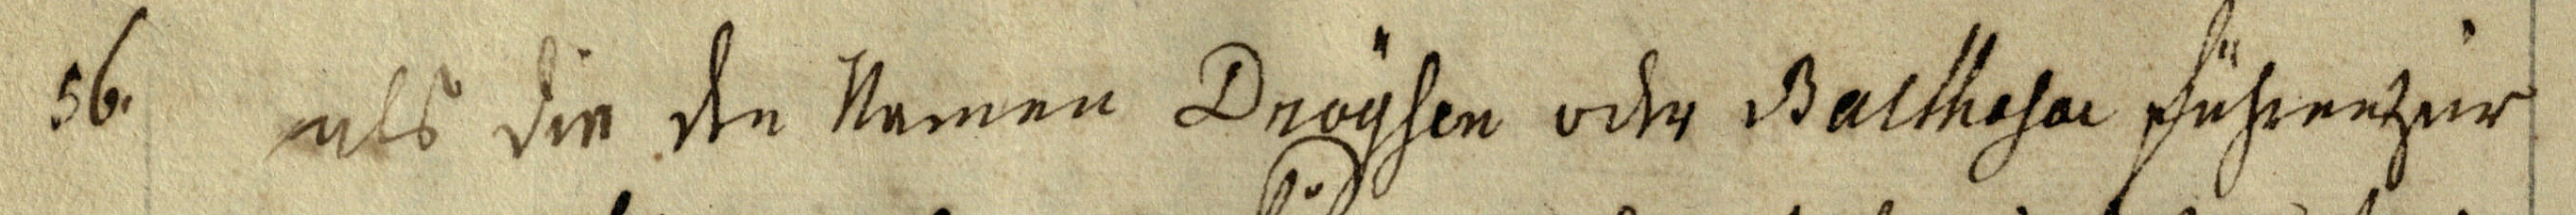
als die den Namen Droÿsen oder Balthasar führen zur
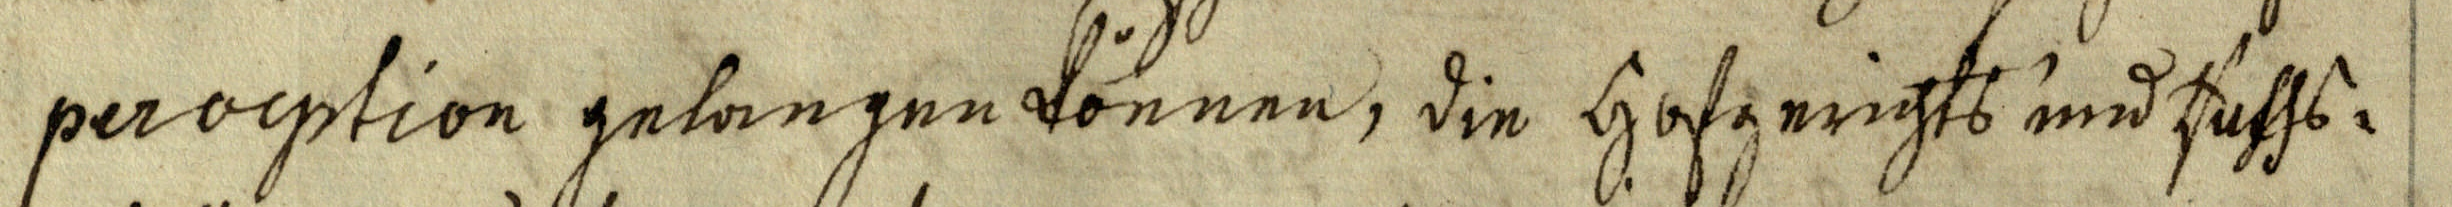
perception gelangen können, die Hofgerichts und Raths¬
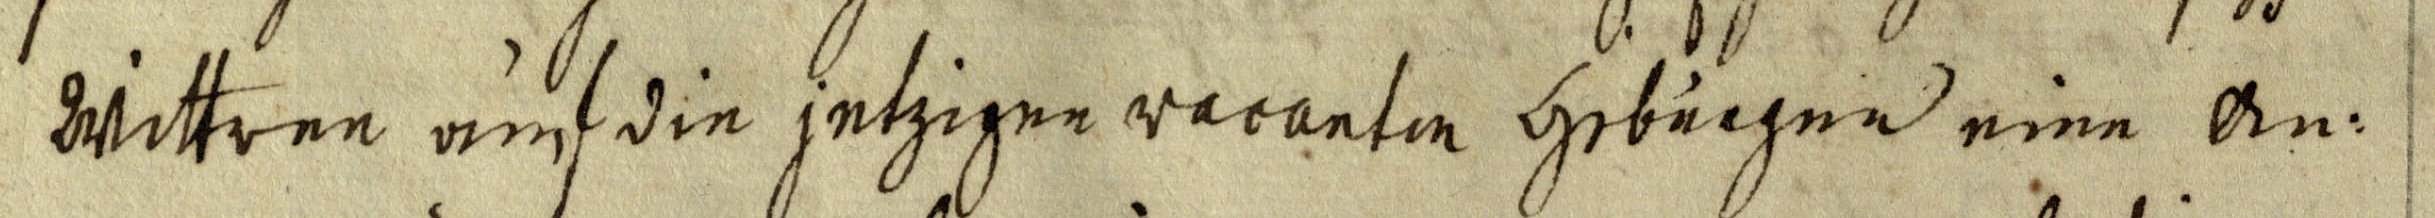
Wittwen auf die jetzigen vacanten Hebungen eine An¬
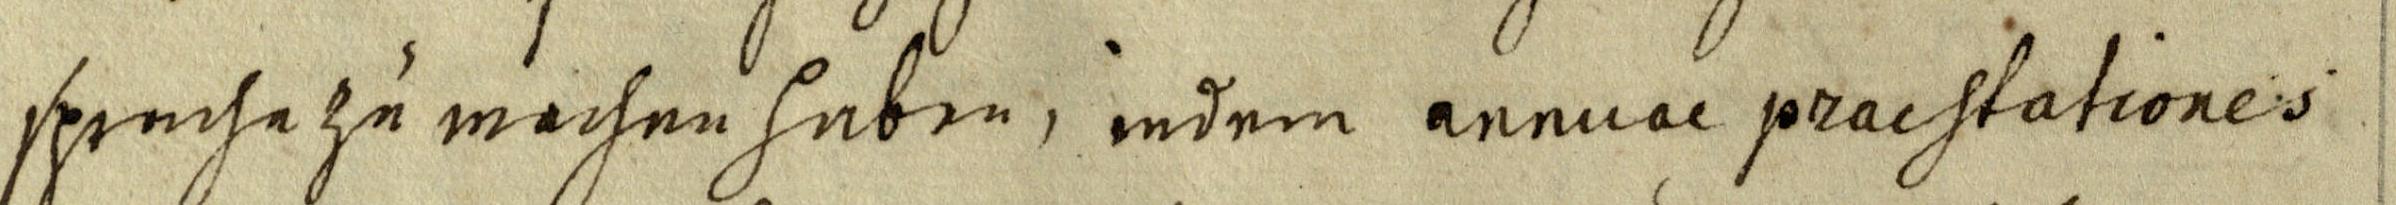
sprache zu machen haben, indem annuae praestationes
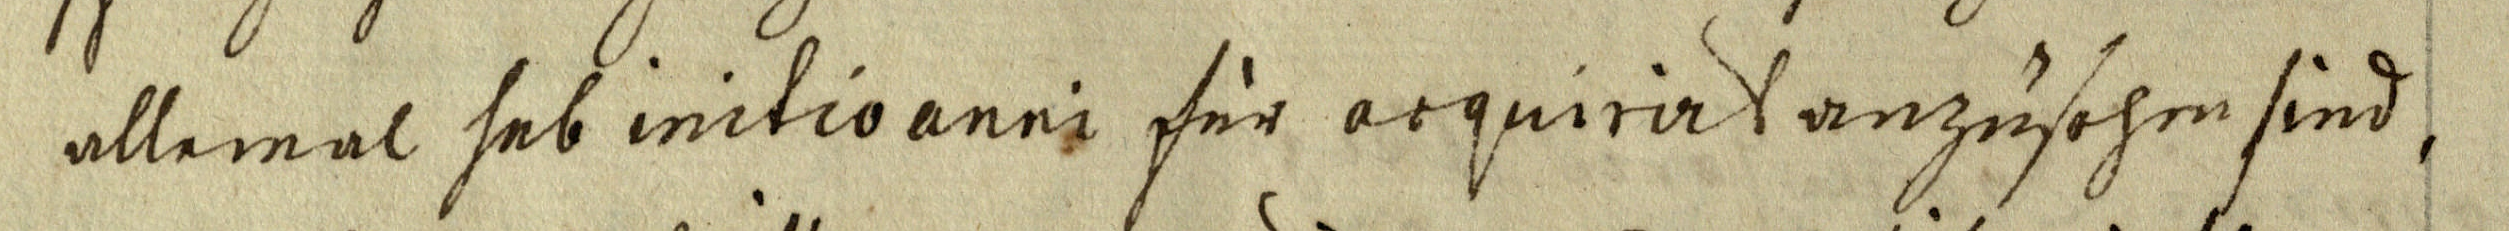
allemal sub initio anni für aquirirt anzusehen sind,
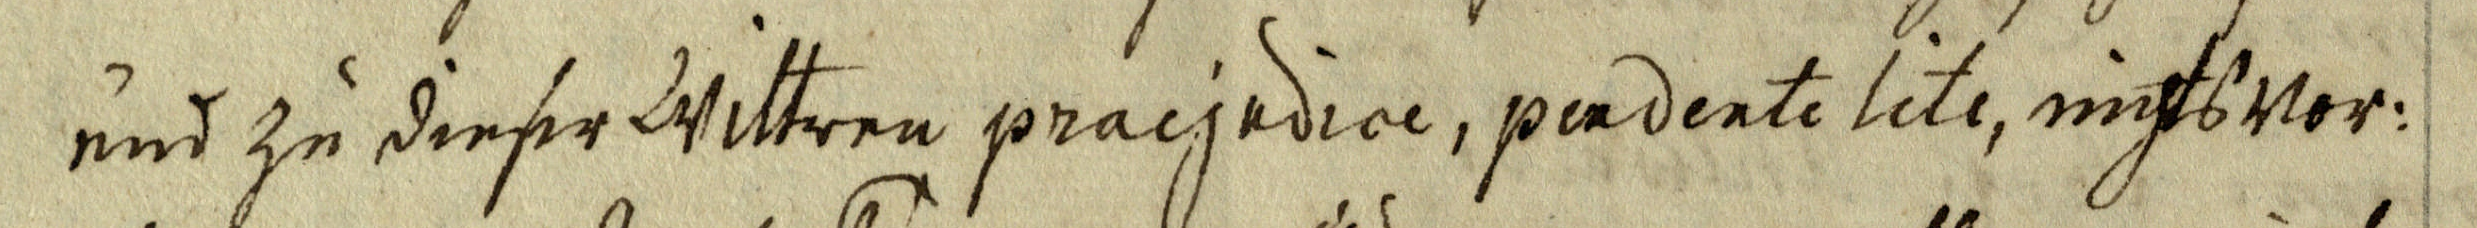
und zu dieser Wittwen praejudice, pendente lite, nichts vor¬
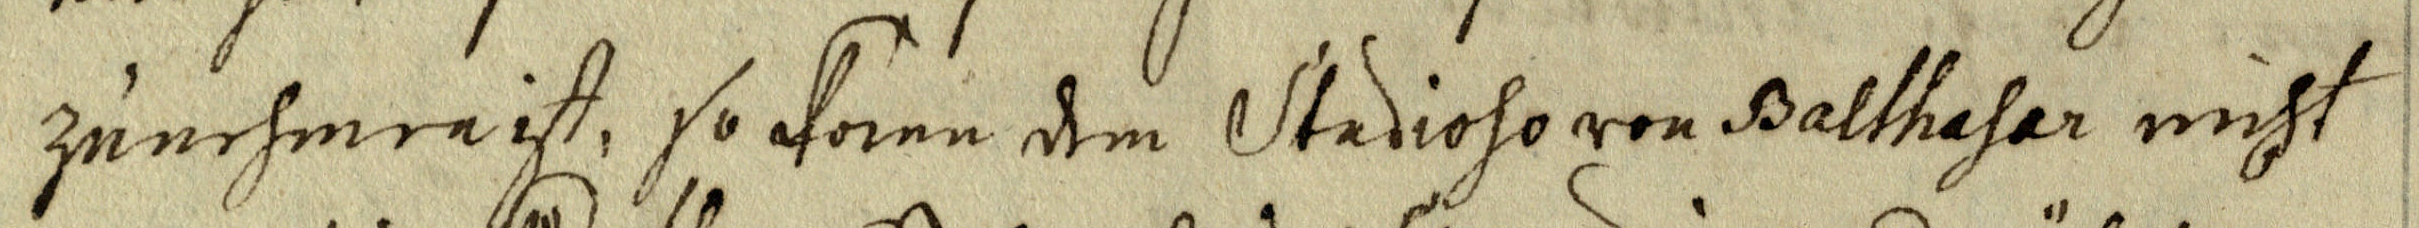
zunehmen ist, so kann dem Studioso von Balthasar nicht
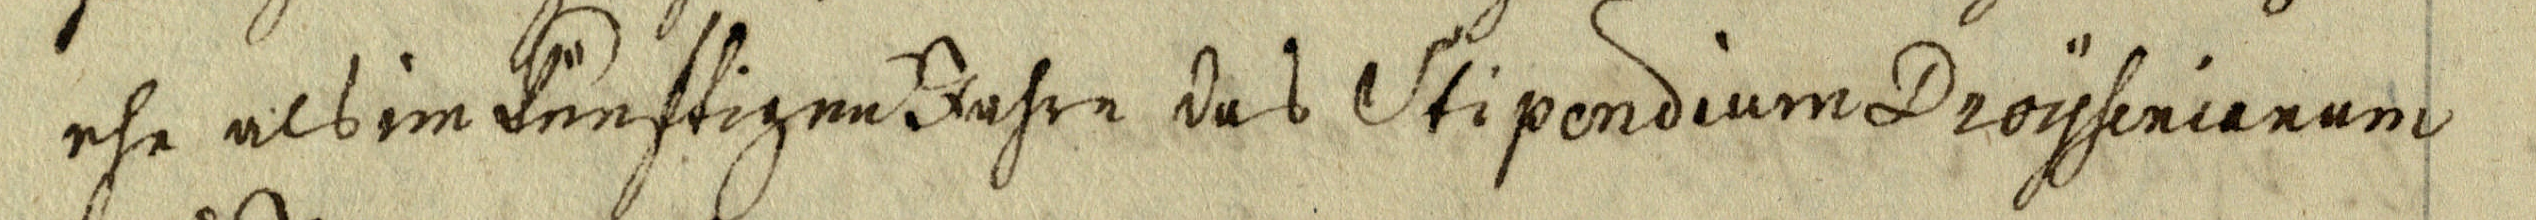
ehe als im künftigen Jahre das Stipendium Droÿsenianum
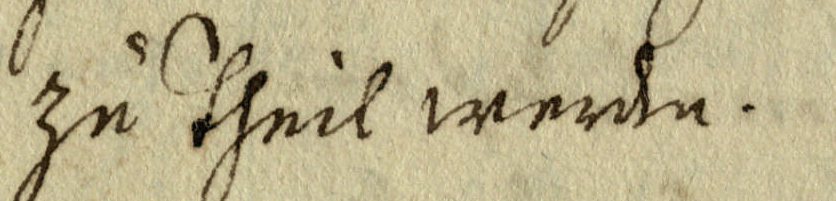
zu Theil werden.
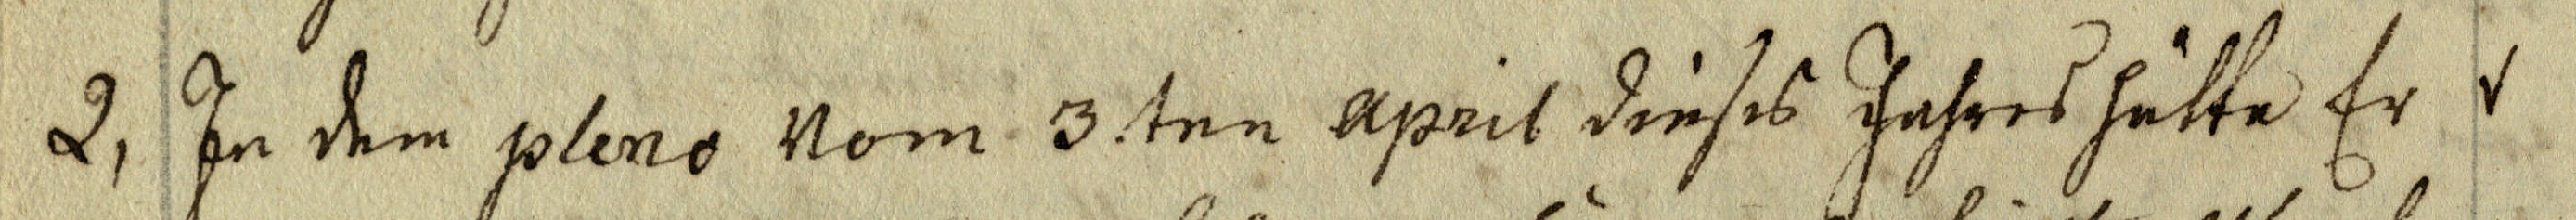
2, In dem pleno vom 3 ten April dieses Jahres hätte Er
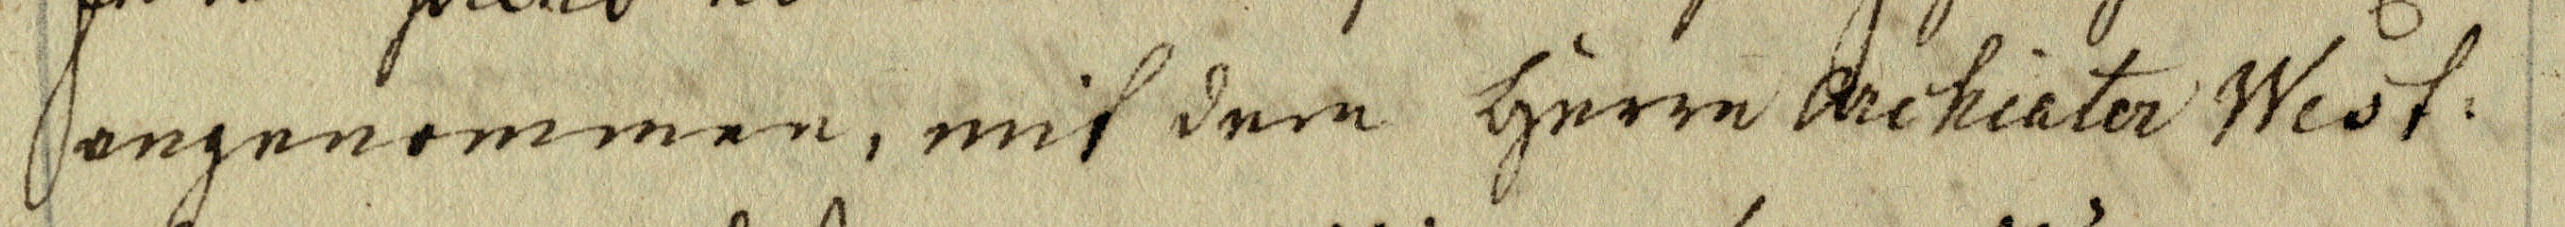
angenommen, mit dem Herrn Archiater West¬
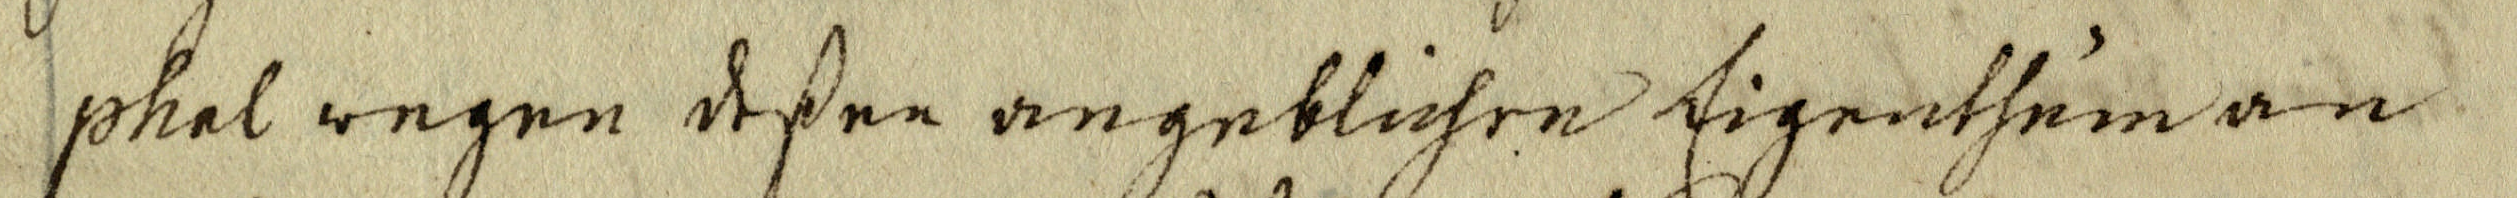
phal wegen deßen angeblichen Eigenthum an
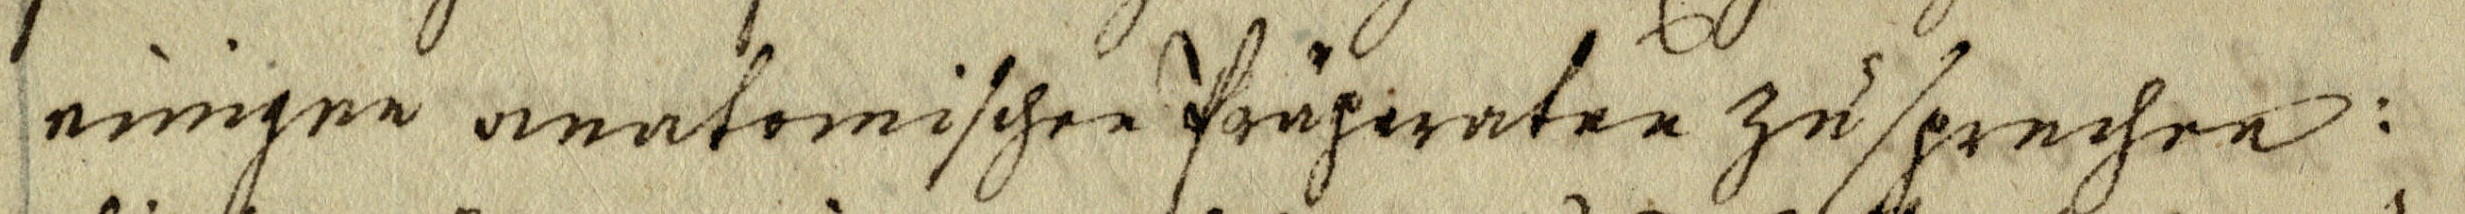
einigen anatomischen Präparaten zu sprechen:
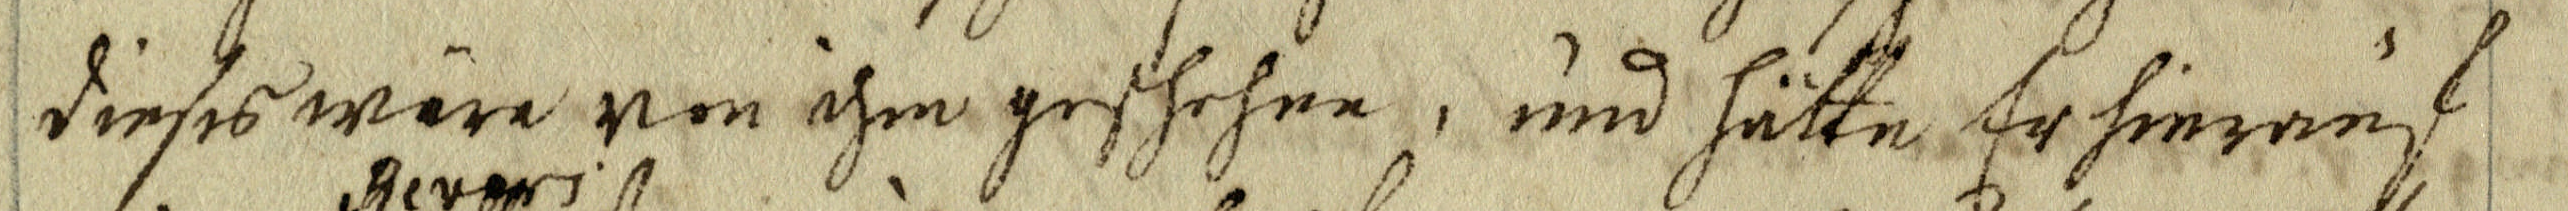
dieses wäre von ihm geschehen, und hätte Er hierauf
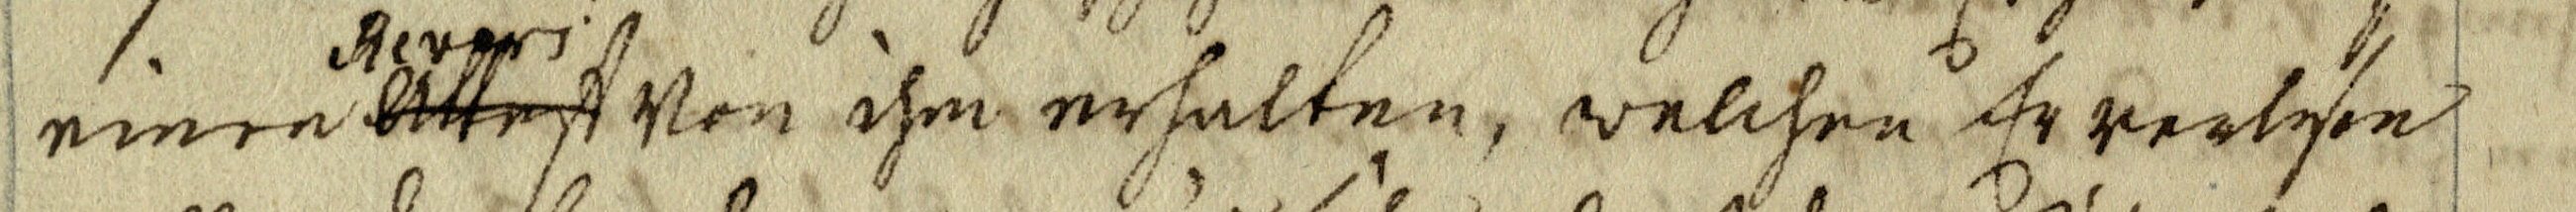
einen Revers von ihm erhalten, welchen Er verlesen
